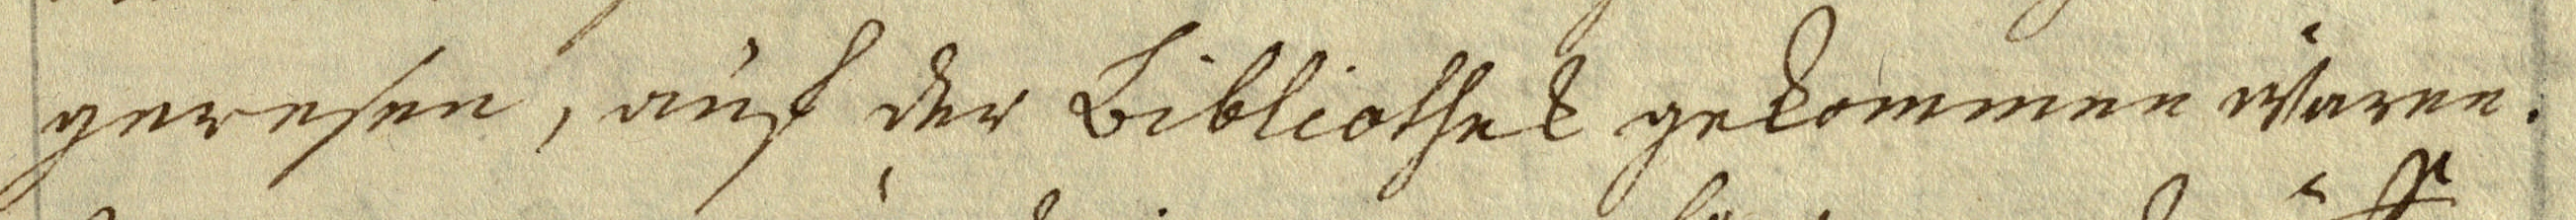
gewesen, auf der Bibliothek gekommen wären.
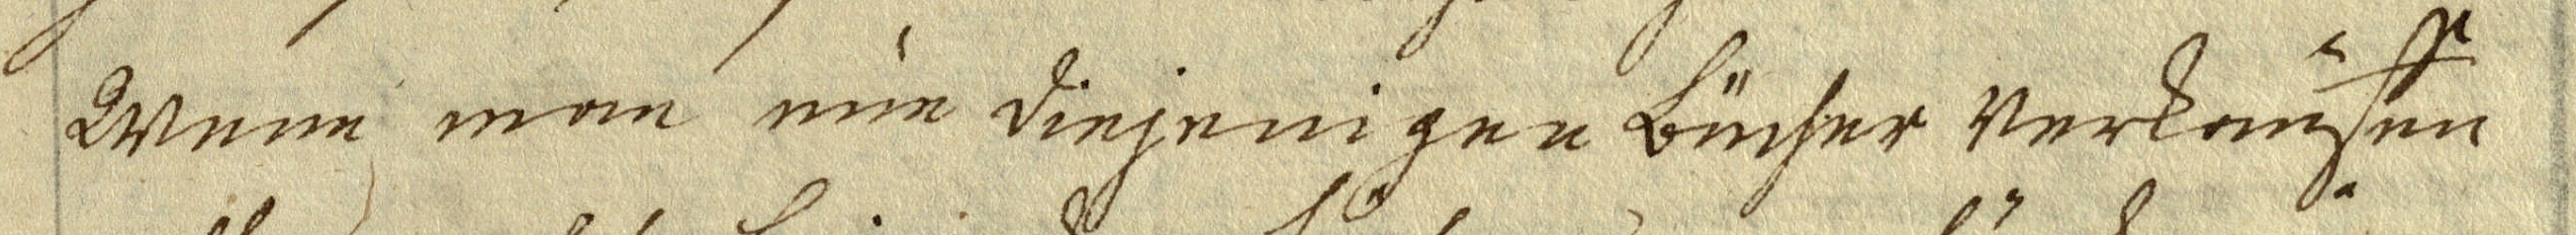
Wenn man nun diejenigen Bücher verkaufen
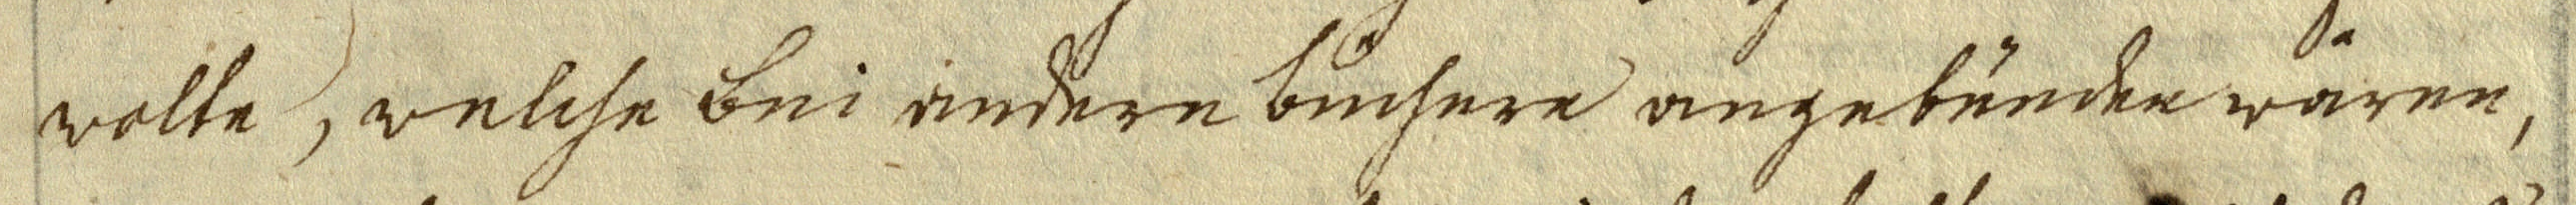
wollte, welche bei andern Büchern angebunden wären,
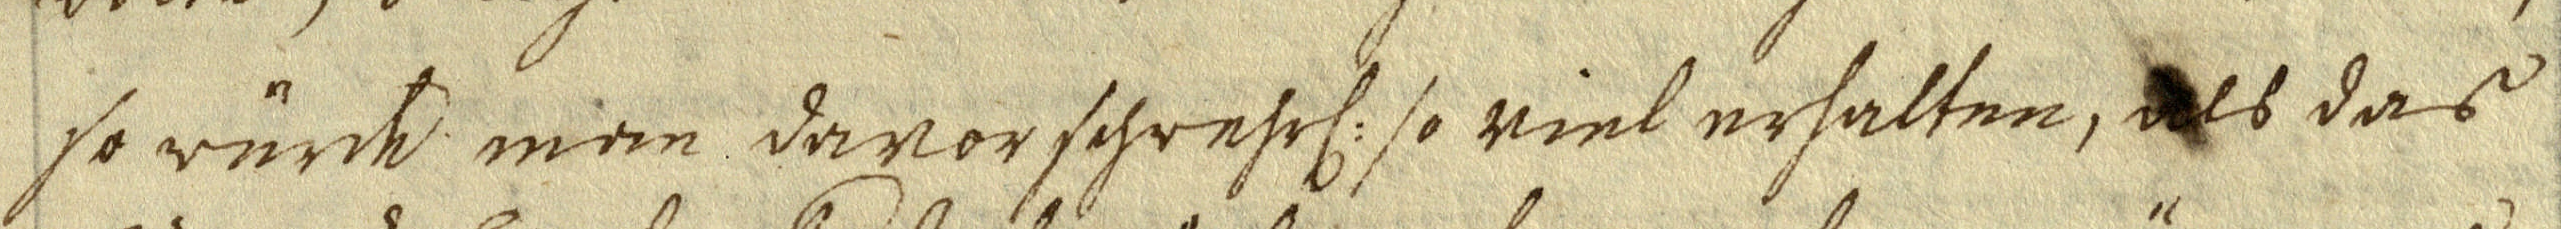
so würde man davor schwehrl: so viel erhalten, als das
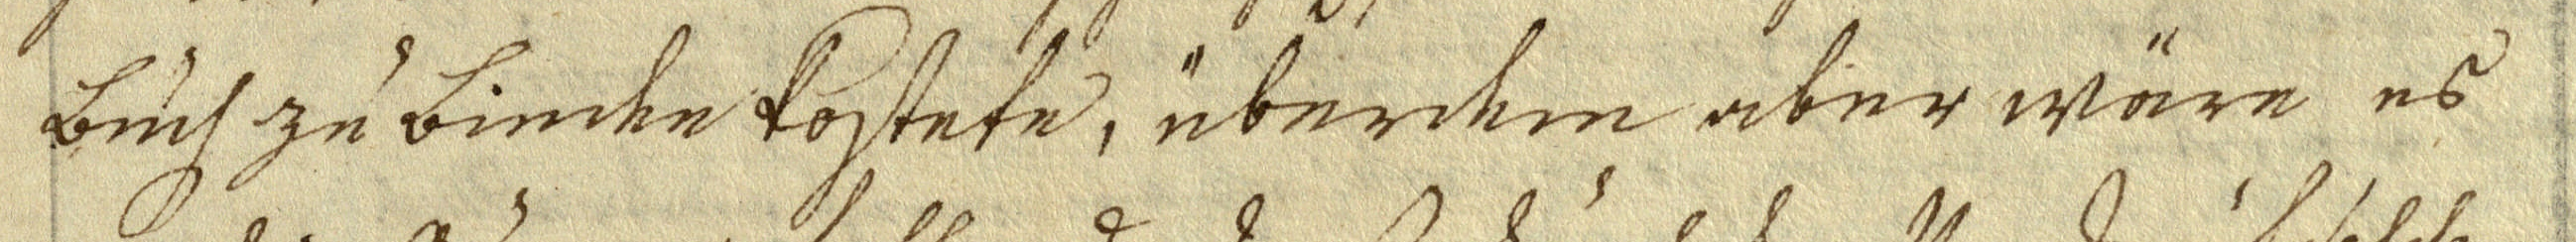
Buch zu binden kostete, überdem aber wäre es
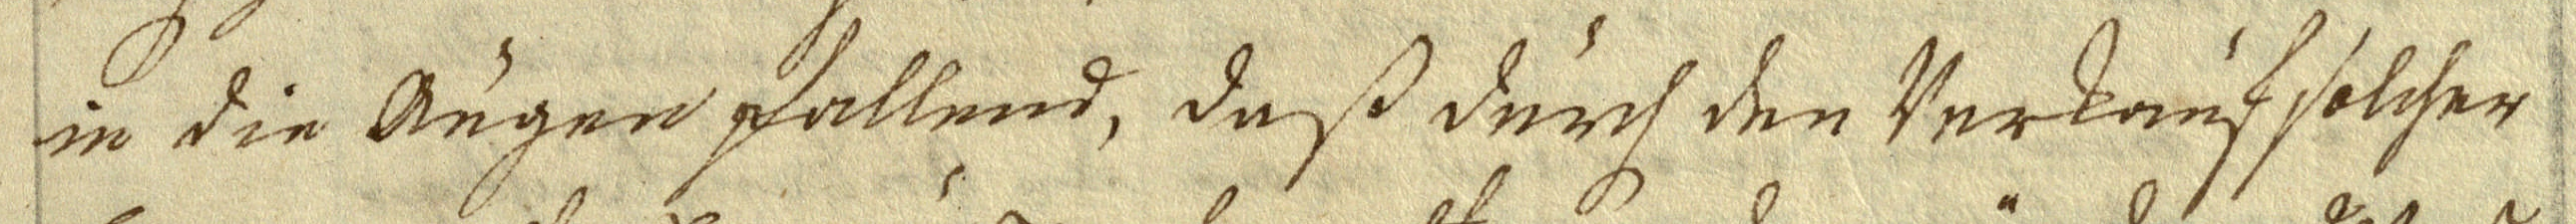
in die Augen fallend, daß durch den Verkauf solcher
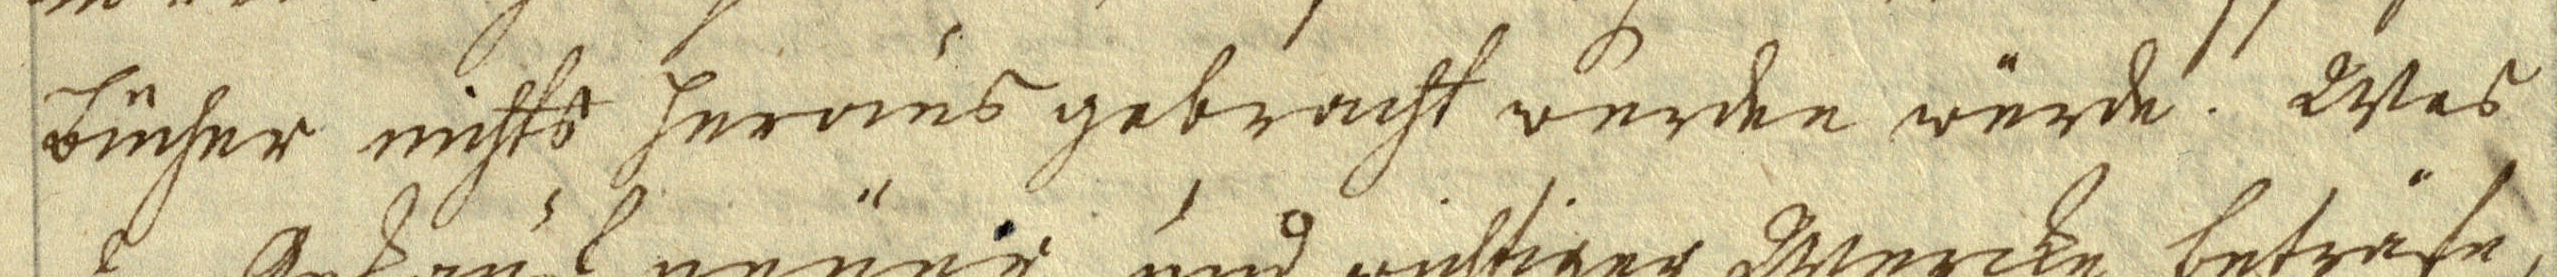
Bücher nichts heraus gebracht werden würde. Was
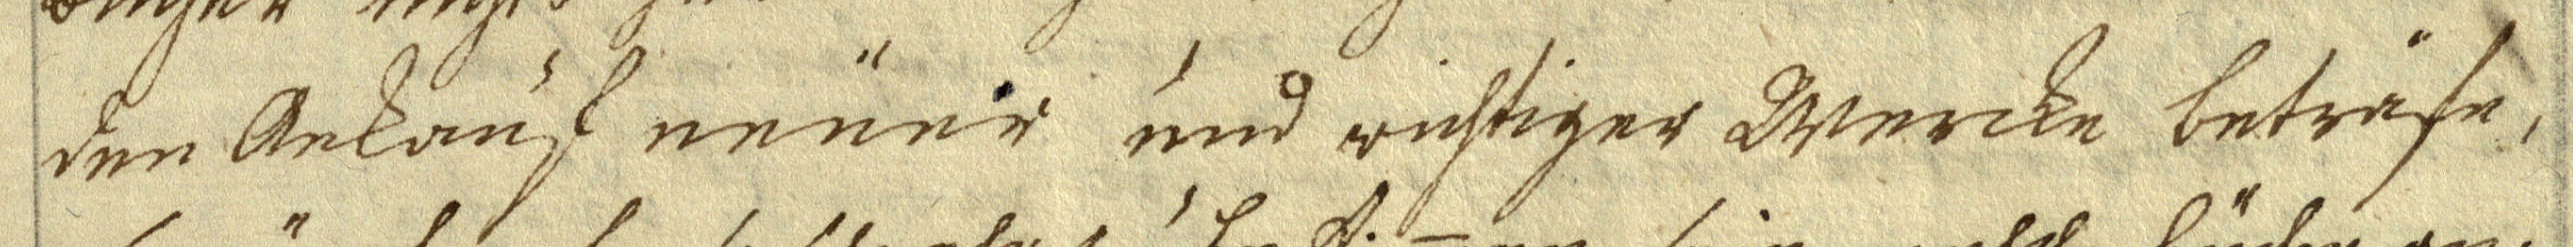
den Ankauf neuer und wichtiger Wercke beträfe,
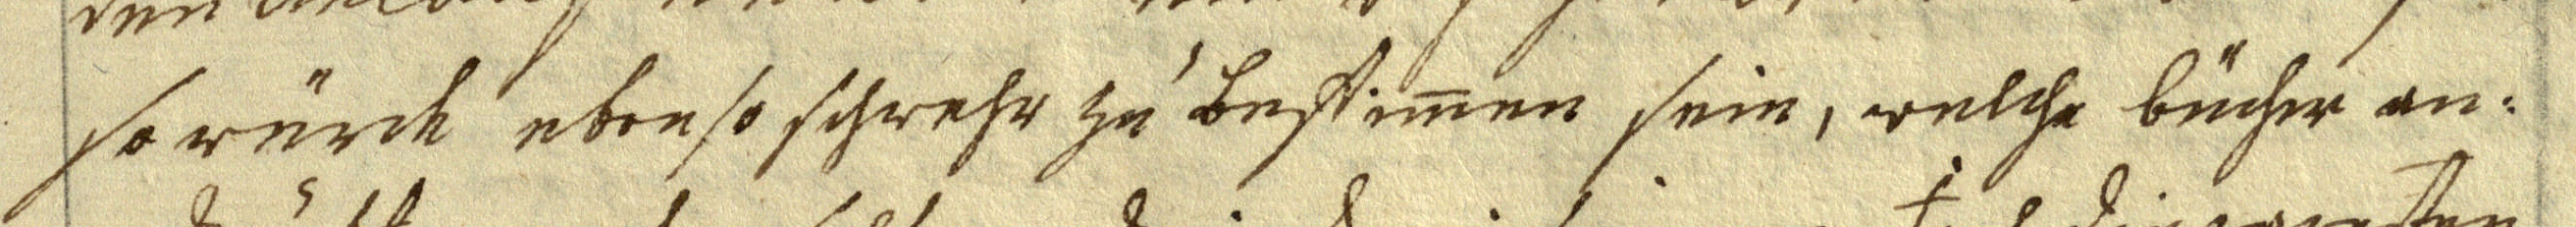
so würde ebenso schwehr zu bestimmen sein, welche bücher an¬
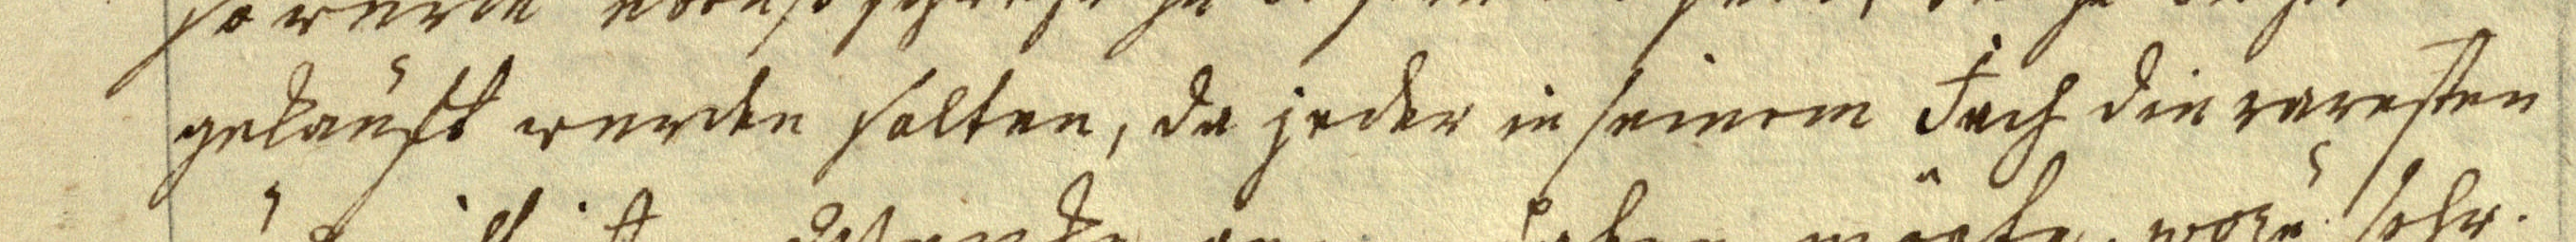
gekauft werden solten, da jeder in seinem Fach die raresten
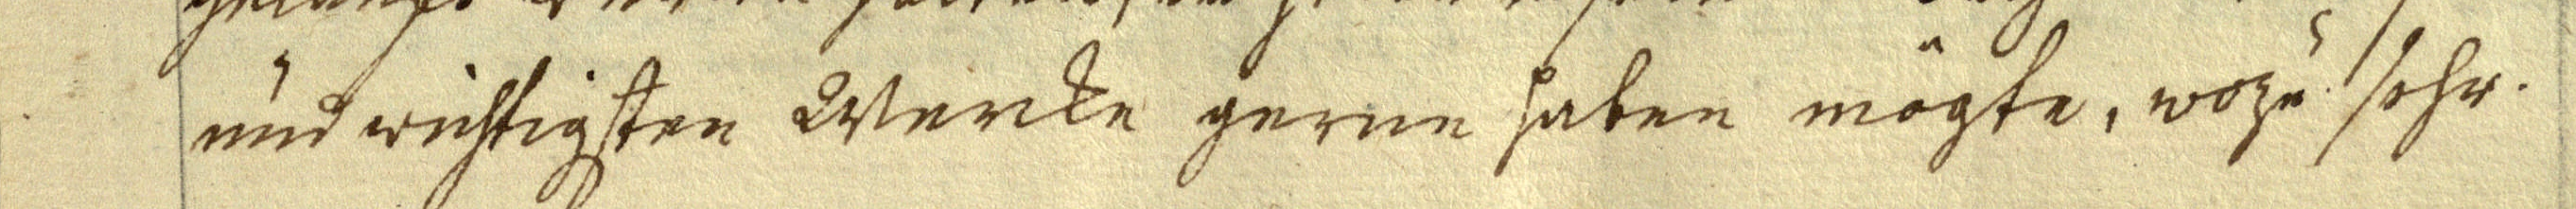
und wichtigsten Wercke gerne haben mögte, wozu sehr
